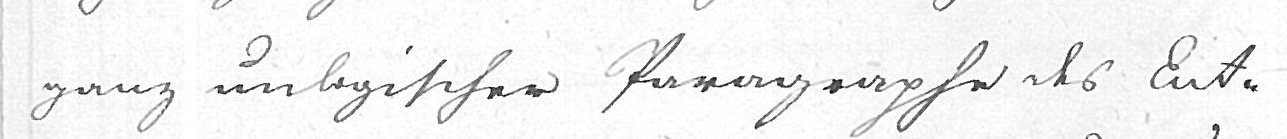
ganz unlogischer Paragraphee des Ent-
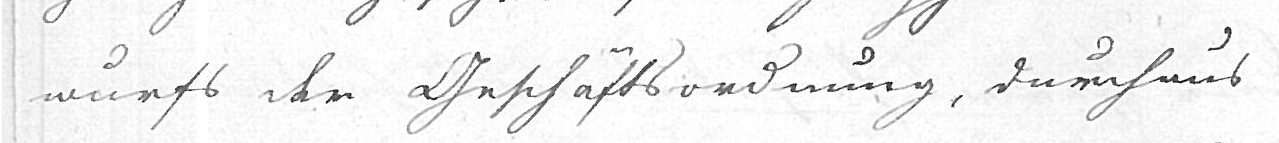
wurfs der Geschäftsordnung, durchaus
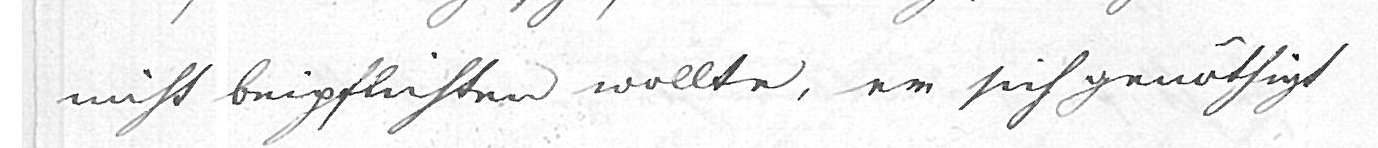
nicht beipflichten wollte, er sich genöthigt
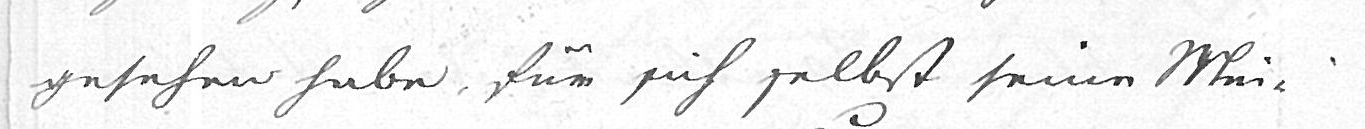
gesehen habe, für sich selbst seine Mei-
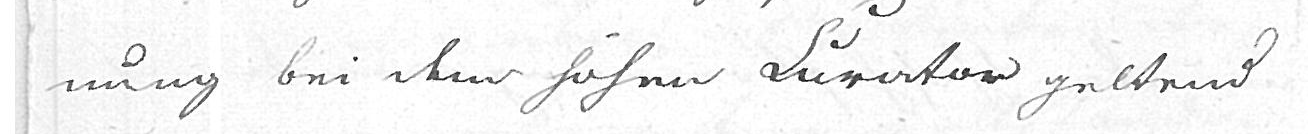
nung bei dem hohen Curator geltend
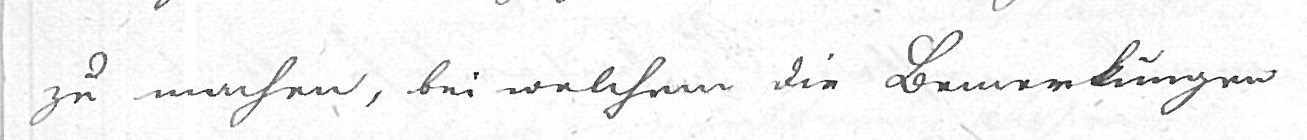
zu machen, bei welchem die Bemerkungen
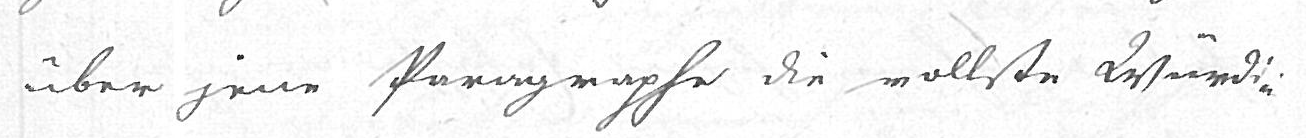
über jene Paragraphe die vollste Würdi-
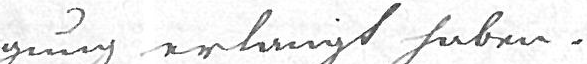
gung erlangt haben.
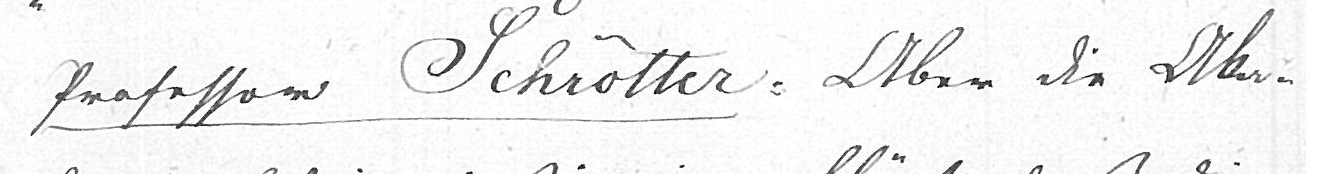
Professor Schrötter: Aber die Aka-
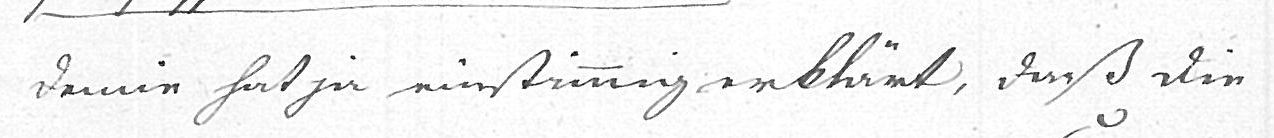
demie hat ja einstimmig erklärt, daß die
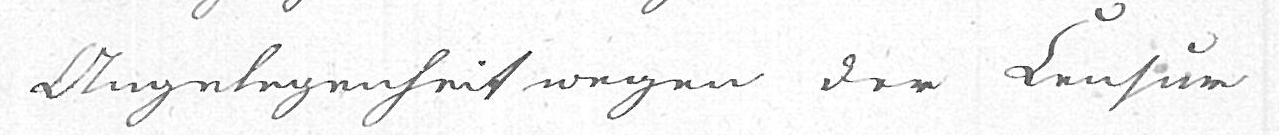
Angelegenheit wegen der Censur
